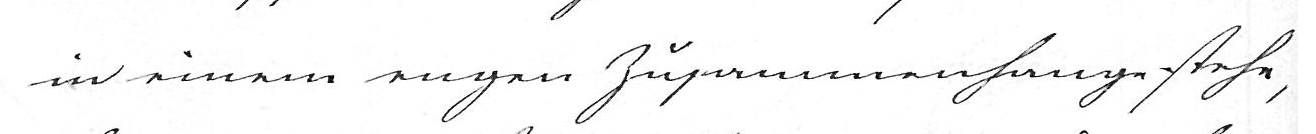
in einem engen Zusammenhang stehe,
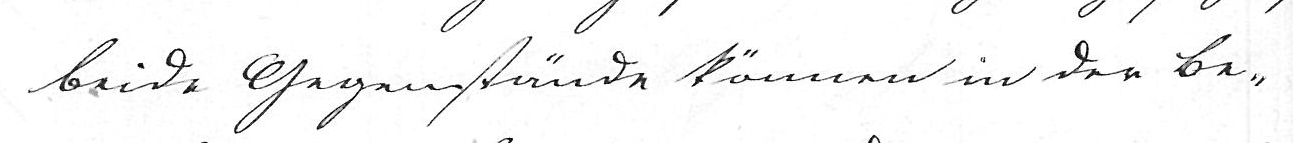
beide Gegenstände können in der Be-
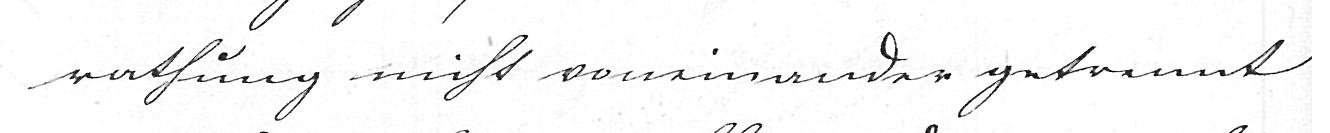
rathung nicht voneinander getrennt
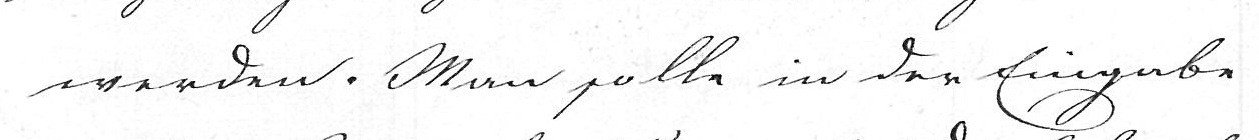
werden. Man solle in der Eingabe
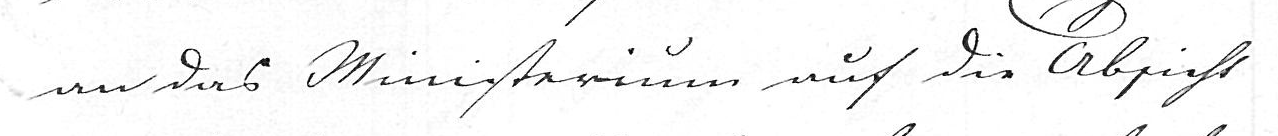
an das Ministerium auf die Absicht
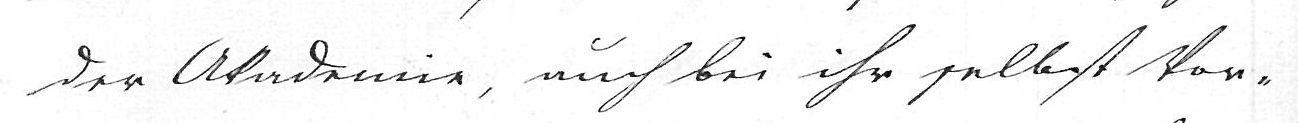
der Akademie, auch bei ihr selbst Vor-
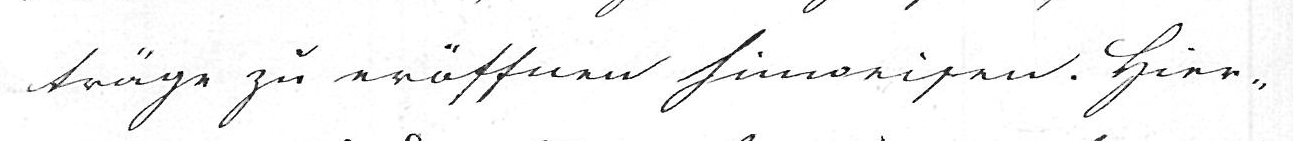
träge zu eröffnen hinweisen. Hier-
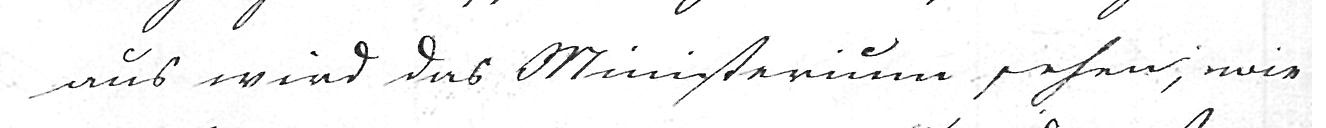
aus wird das Ministerium sehen, wie
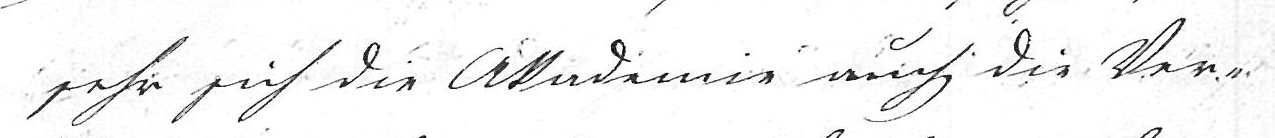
sehr sich die Akademie auch die Ver-
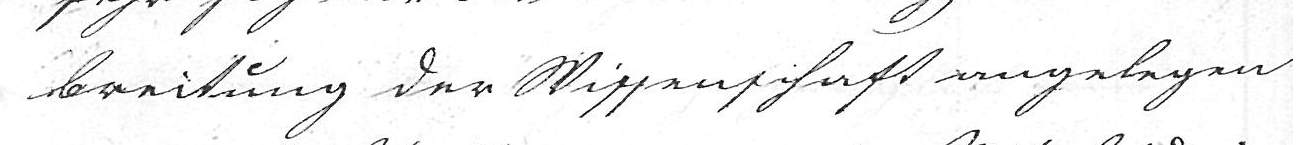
breitung der Wissenschaft angelegen
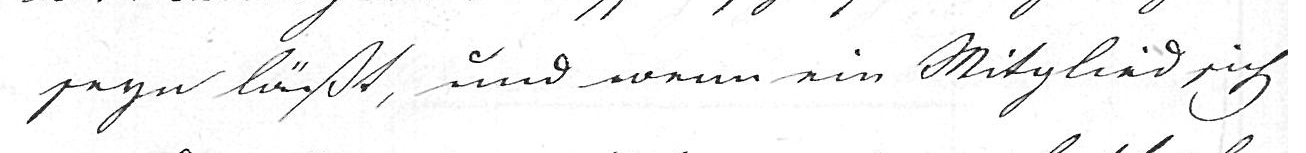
seyn läßt, und wenn ein Mitglied sich
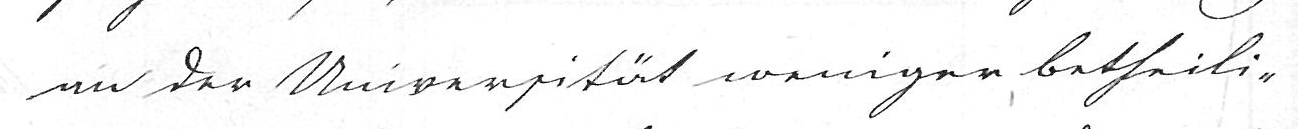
an der Universität weniger betheili-
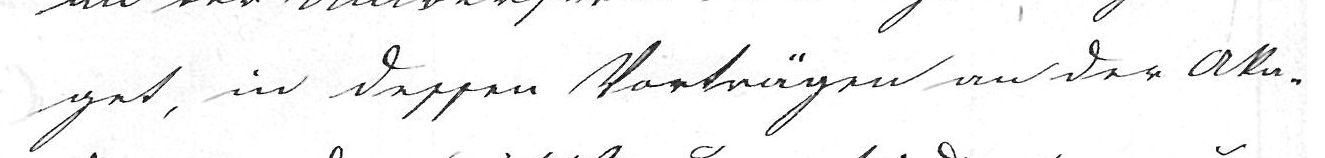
get, in dessen Vortägen an der Aka-
